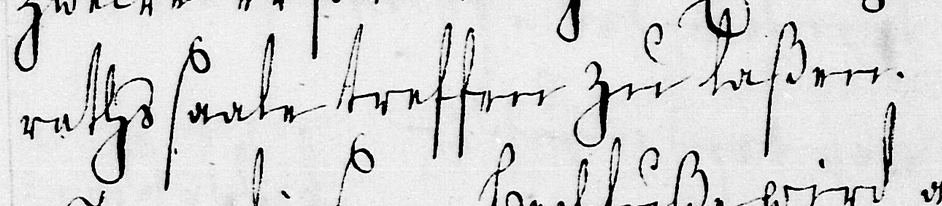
rathssaale treffen zu laßen.
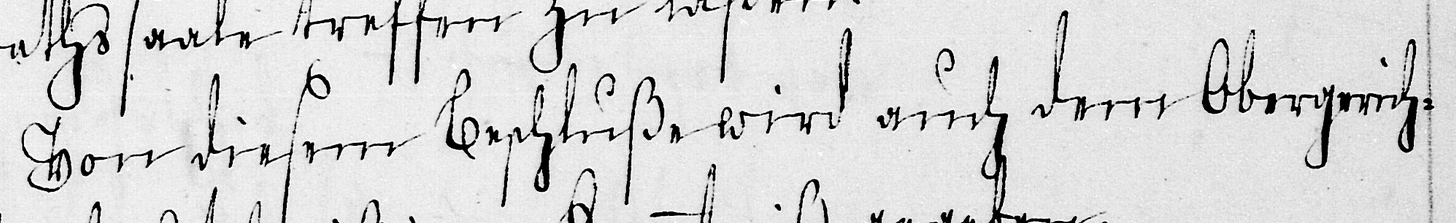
Von diesem Beschluße wird auch dem Obergerich¬
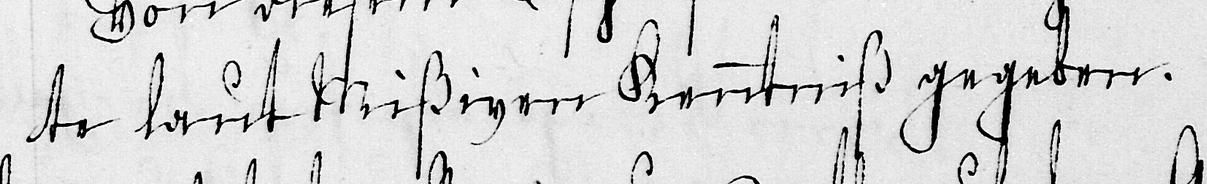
te laut Mißiven Kenntniß gegeben.
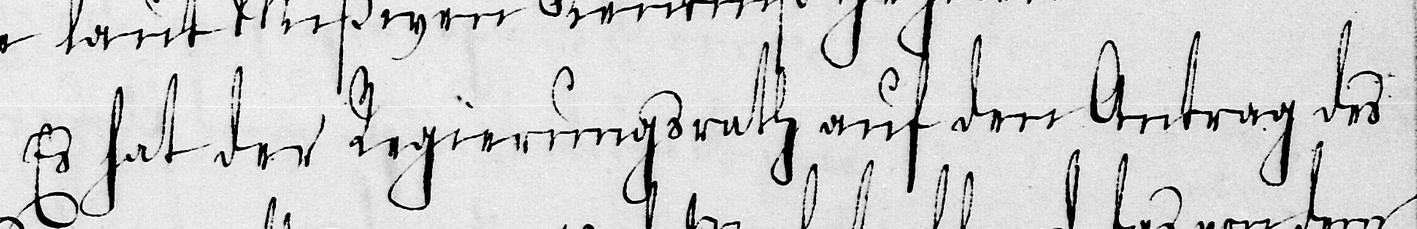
Es hat der Regierungsrath auf den Antrag des
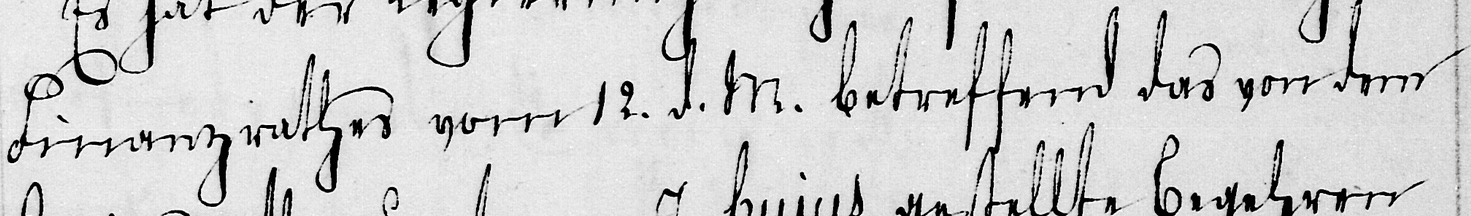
Finanzrathes vom 12. d. M. betreffend das von dem
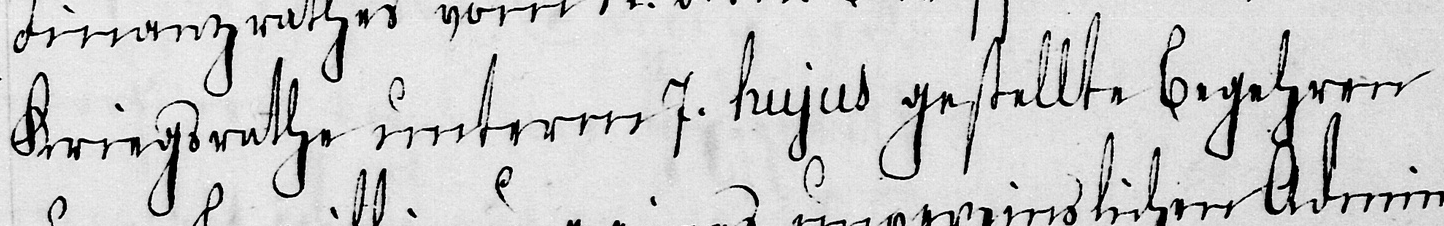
Kriegsrathe unterm 7. hujus gestellte Begehren
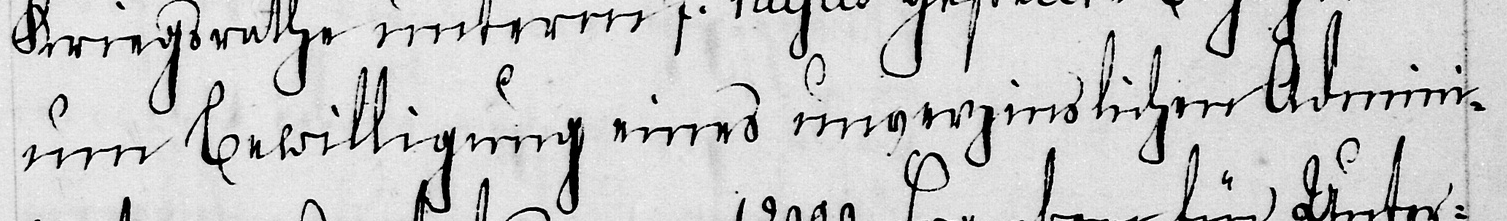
um Bewilligung eines unverzinslichen Adminis¬
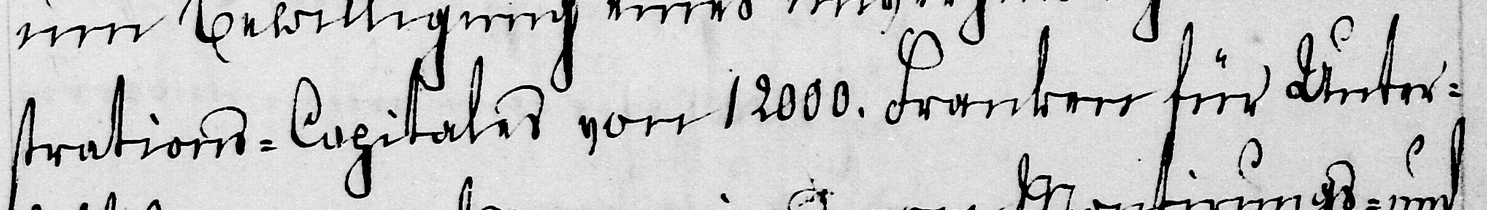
trations-Capitales von 12 000. Franken für Unter¬
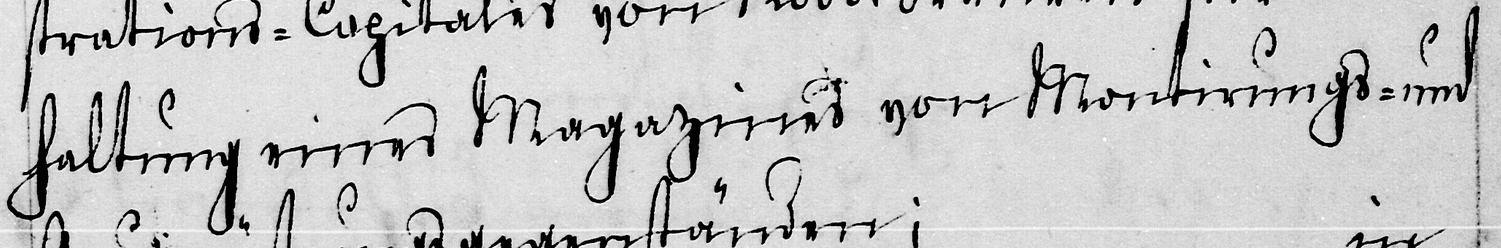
haltung eines Magazines von Montirungs- und
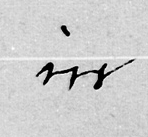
eines
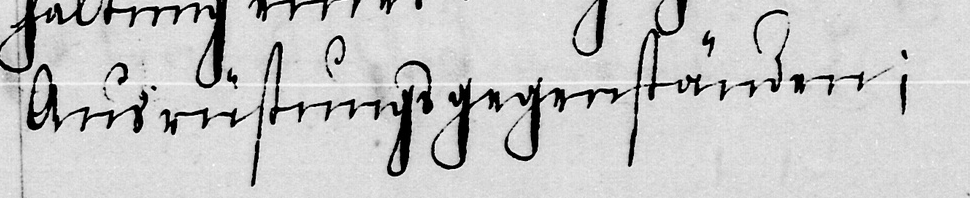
Ausrüstungsgegenständen;
